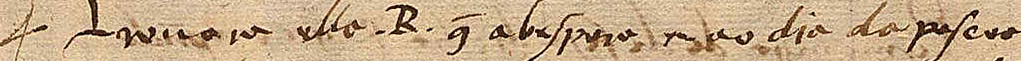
4 Prouara ella .R. q̄ a bespora e ao dia da pascoa
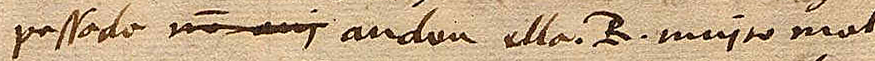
passada nō auj andou ella .R. mujto mal
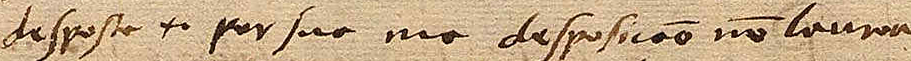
desposta e por sua ma desposiçaõ nō laurou
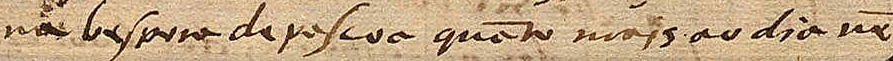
na bespora de pascoa quāto majs ao dia nē
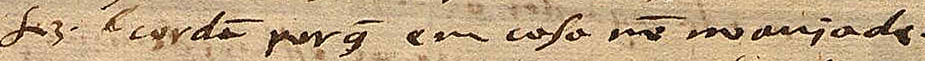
fez. cordā porq̄ em casa nō no auja de
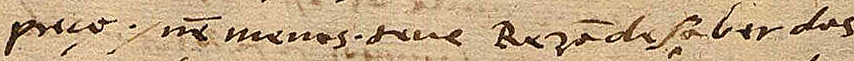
preço ./ nēmenos. teue Rezā de saber das
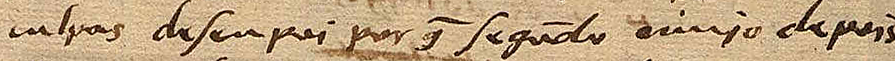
culpas de seu pai porq̄ segūdo ouujo depois
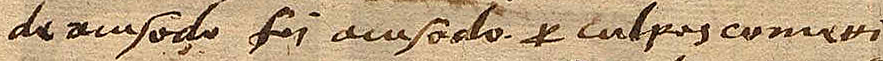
de acusado foi acusado. ꝑ culpas cometti
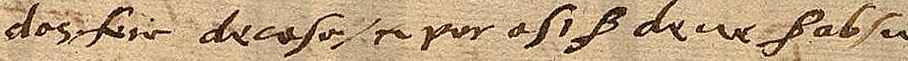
das fora de casa / e por asi ꞩ deue ꞩ absu
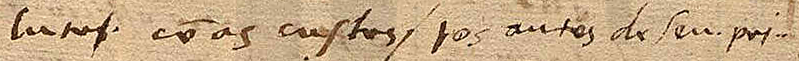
luta /. cō as custas / os autos de seu paj.
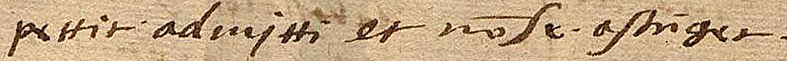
pettit admijtti et nō se astrīget.
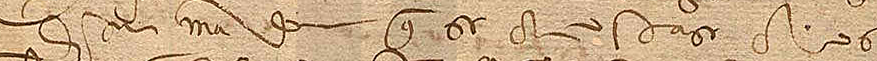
dtor m̄adou q̄ se Acostase Aos
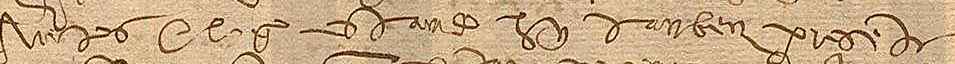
Autos e logo estamdo hy tanbem presēte
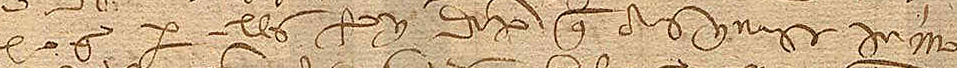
logo ꝑ elles foy ditō q̄ Asynase termo
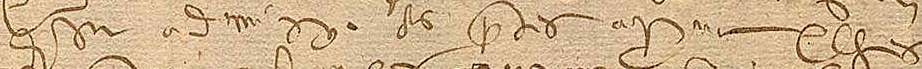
dtor ademityo As p̄tes a ꝓua e lhes
